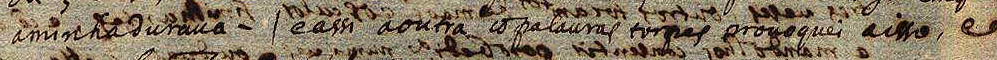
a minha duraua / e assi a outra cō palauras torpes prouoquei a isso, e
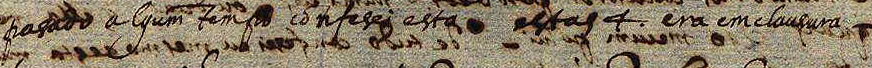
pasado algum tempo confesei esta _ estas 4. era em clausura -
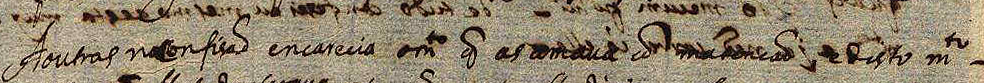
A outras na confisaõ encarecia o mto q̄ as amaua cō ma tençaõ, e disto mto -
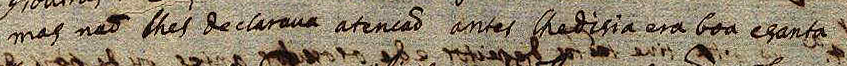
mas naõ lhes declaraua a tençaõ antes lhe disia era boa e santa
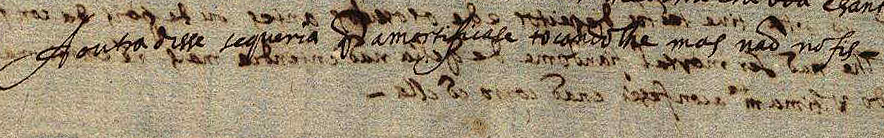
A outra disse se queria q̄ a mortificase tocandolhe mas naõ no fis -
